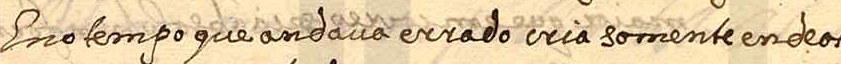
e no tempo que andava errado cria somente en deos
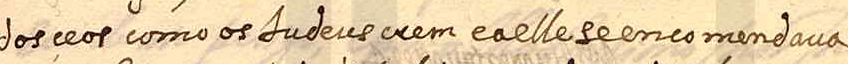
dos çeos como os Judeus crem e a elle se encomendava
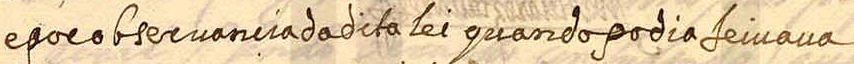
e por observancia da dita lei quando podia Jeiuava
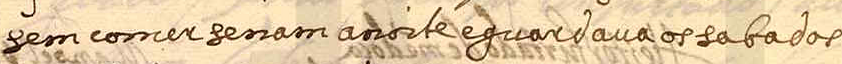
sem comer senam a noite e guardava os sabados
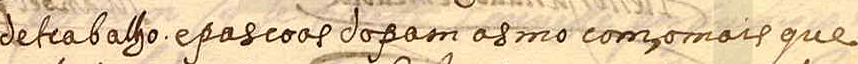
de trabalho e pascoas do pam asmo com o mais que
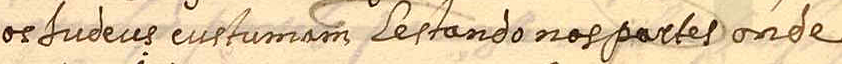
os judeus custumam e estando nas partes onde
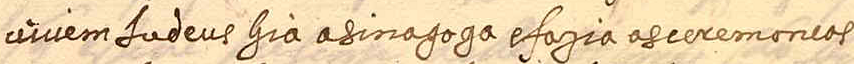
vivem Judeus hia a sinagoga e fazia as ceremoneas
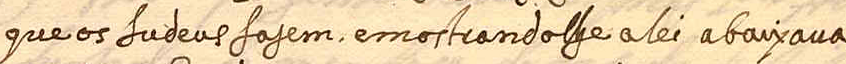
que os Judeus fazem e mostrandolhe a lei abaixava
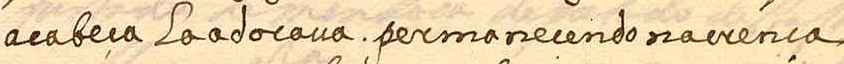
a cabeça e a adorava permanecendo na crença
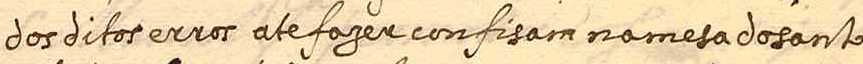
dos ditos erros ate fazer confisam na mesa do santo
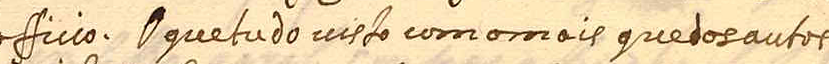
officio. O que tudo visto com o mais que dos autos
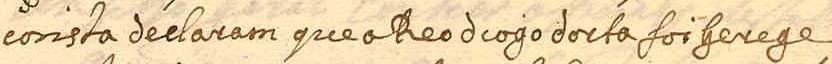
consta declaram que o Reo diogo dorta foi herege
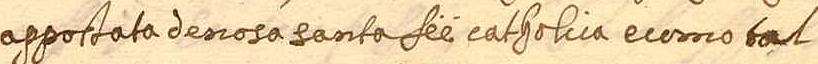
appostata de nosa santa fée catholica e como tal
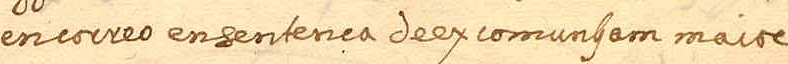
encorreo en sentença de excomunham maior
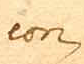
con
